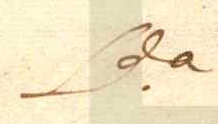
L.da
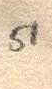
51
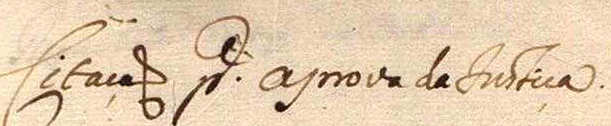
Citaçaõ p.a a prova da Iustiça.
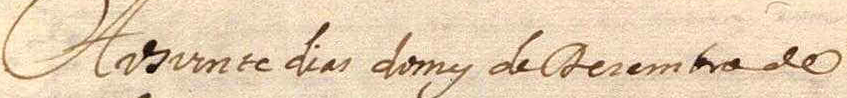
Aos vinte dias do mes de Dezembro de
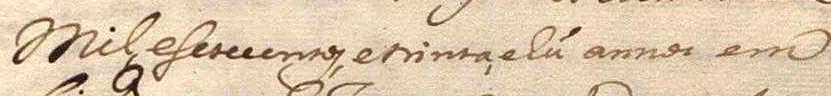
Mil e setecentos, e trinta, e hū annos em
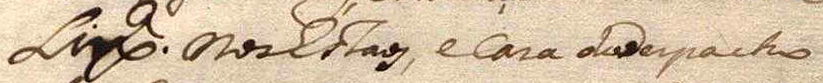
Lix.a. nos Estaos, e caza do despacho
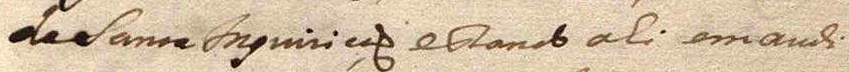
da Santa Inquiziçaõ estando ahi em audi
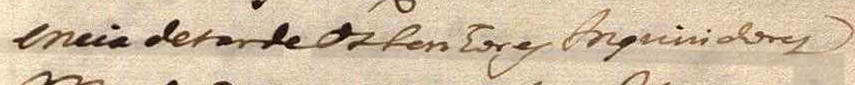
encia de tarde os senhores Inquisidores
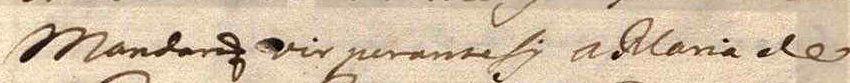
Mandarõ vir perante sy a Maria de
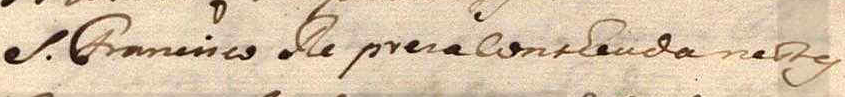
S. Francisco Re preza contheuda nestes
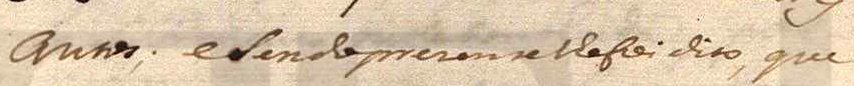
autos; e sendo prezente lhe foi dito, que
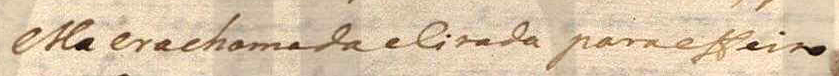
ella era chamada e Citada para effeito
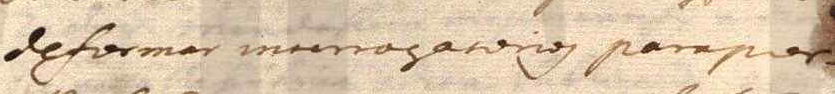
de formar interrogatorios para por
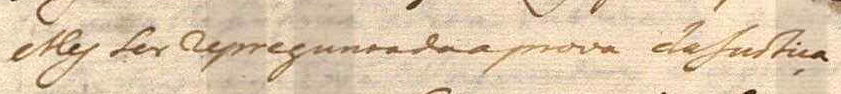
elles ser Repreguntada a prova da Justiça
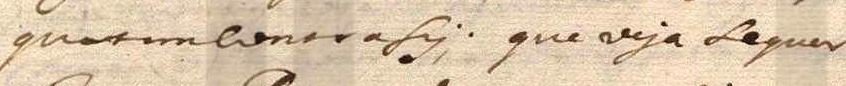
que tem contra sy; que veja se quer
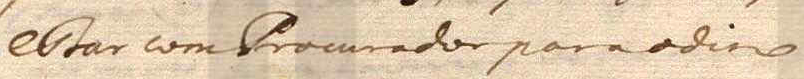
estar com Procurador para o dito
